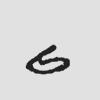㠯（以）
